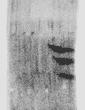三
